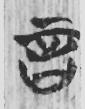言
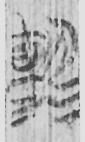{水車刀}
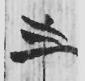之
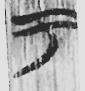于
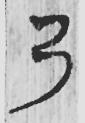乃
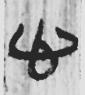心
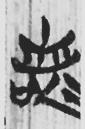若
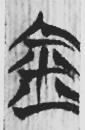金
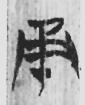甬
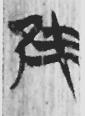隹
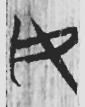女
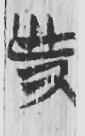拃（作）
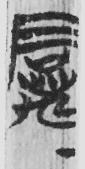{石萬}
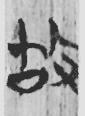故
